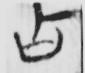占
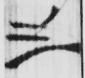之
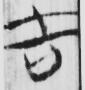吉
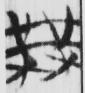無
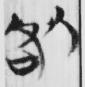咎
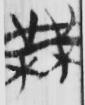無
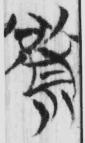○（敓）
